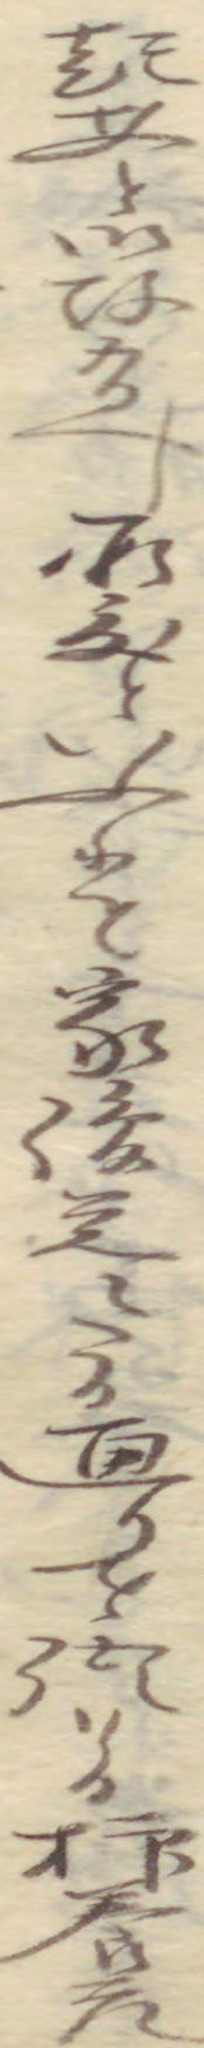起なと御存有へし承度といふにも家歳覚えたる通を語ける抑養老
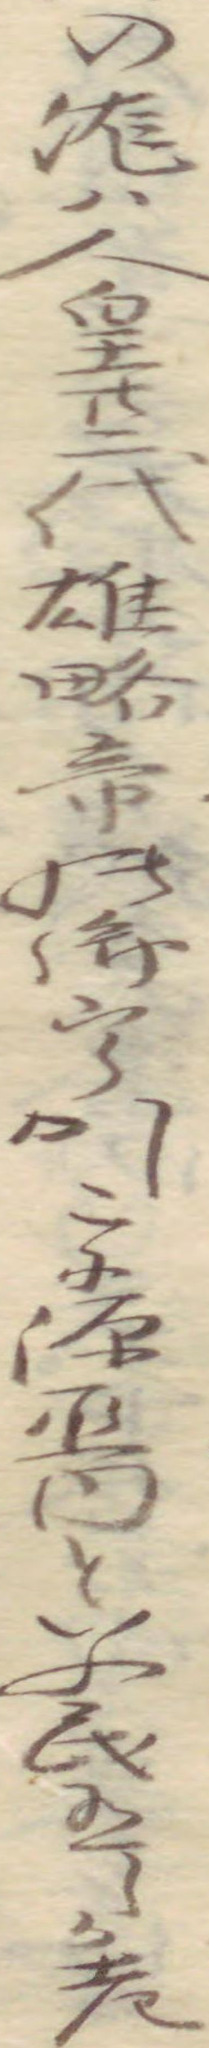の滝は人皇廿二代雄略帝の御宇かしこに源丞内といふ民有しか老
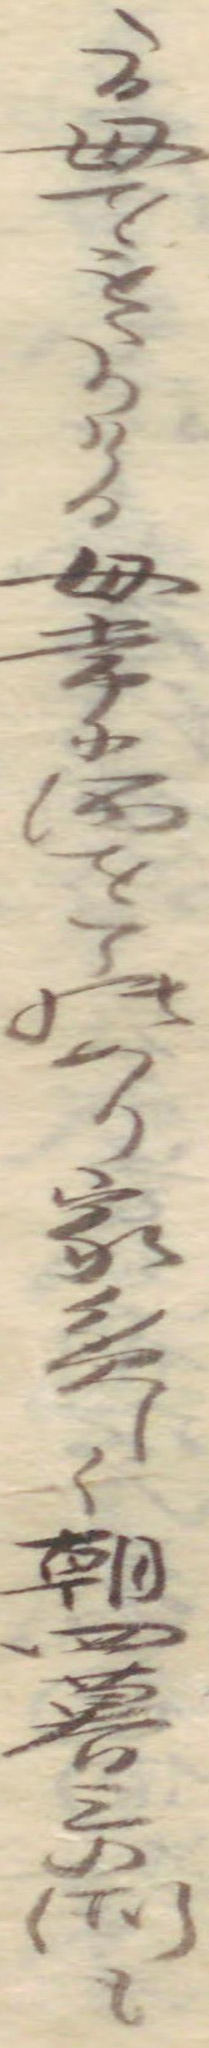たる母をもたりける母常に酒をこのめり家貧しく朝四暮三の例も
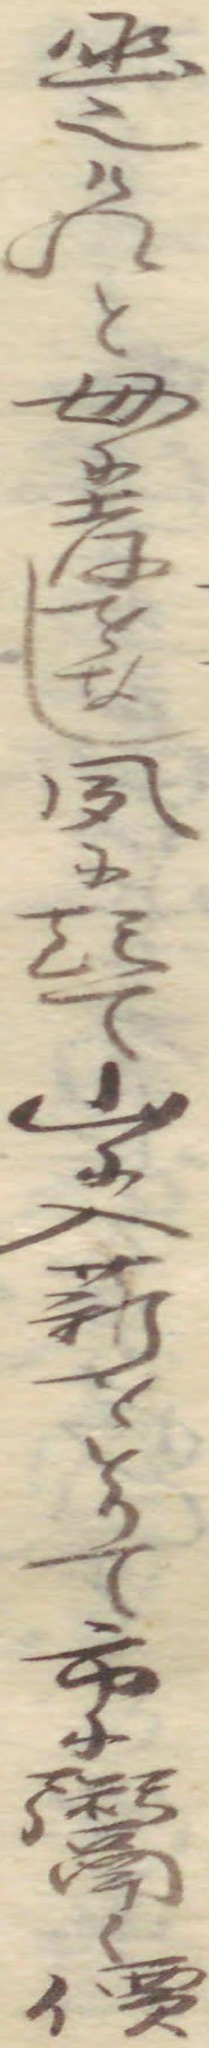幽也けれと母に孝をなし夙に起て山に入薪をとりて市に鬻く価
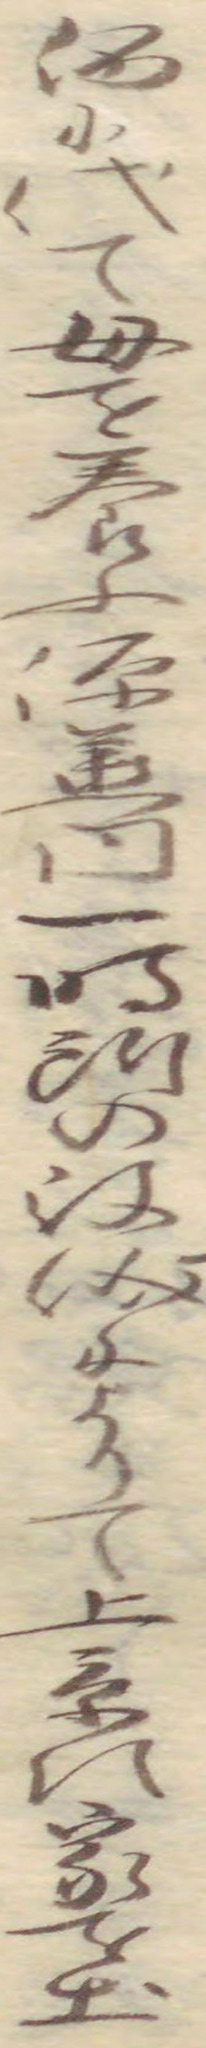酒に代て母を養ふ源丞内一時所の役儀によりて上京す家を出
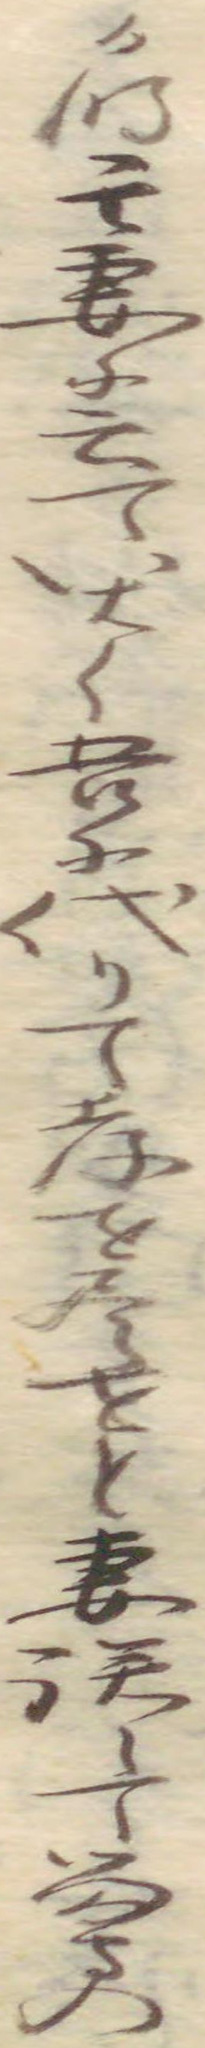る時其妻に云ていはく吾に代りて孝を尽せと妻諾して留寺の
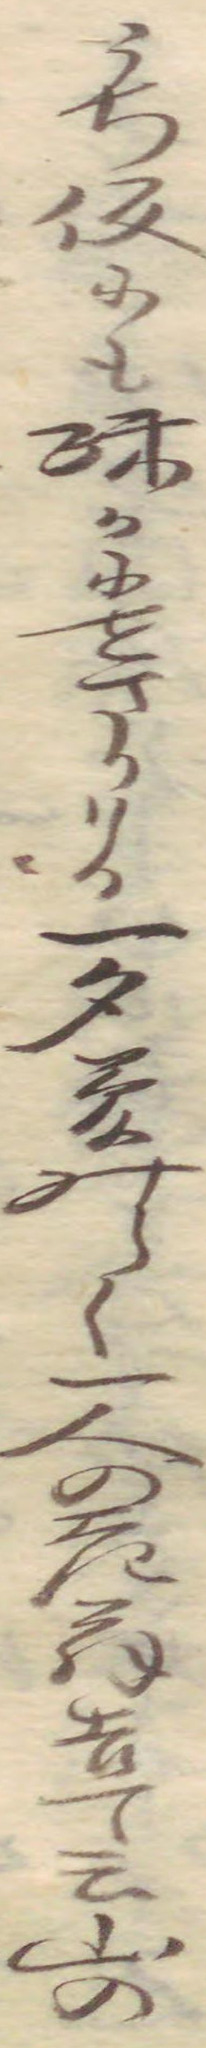うち仮にも疎かにせさりける一夕夢みらく一人の老翁告て云山の
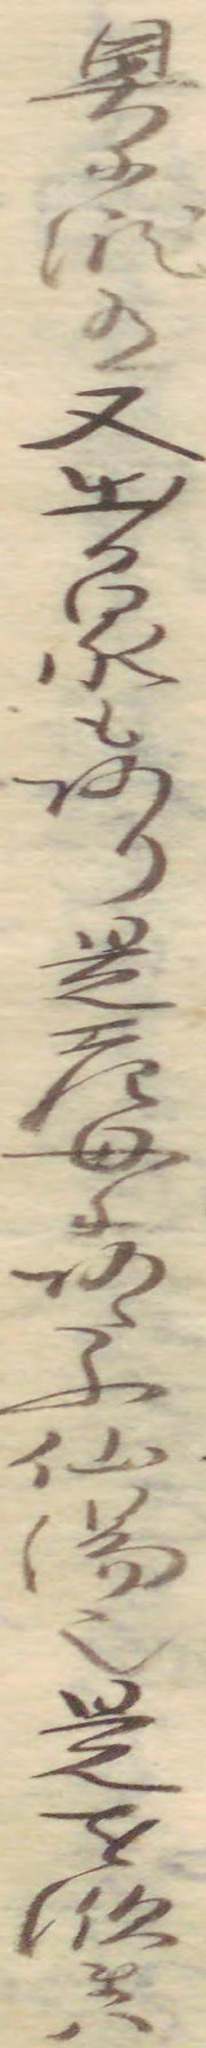奥に滝有又出る泉もあり是老母にあたふ仙湯也是を飲まは
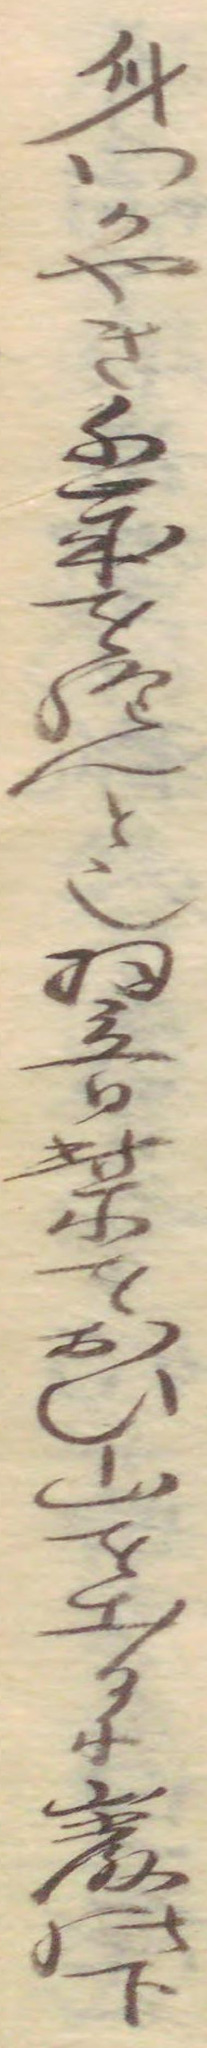身わかやき千年を経んと也翌日柴をおひ山を出るに巌の下

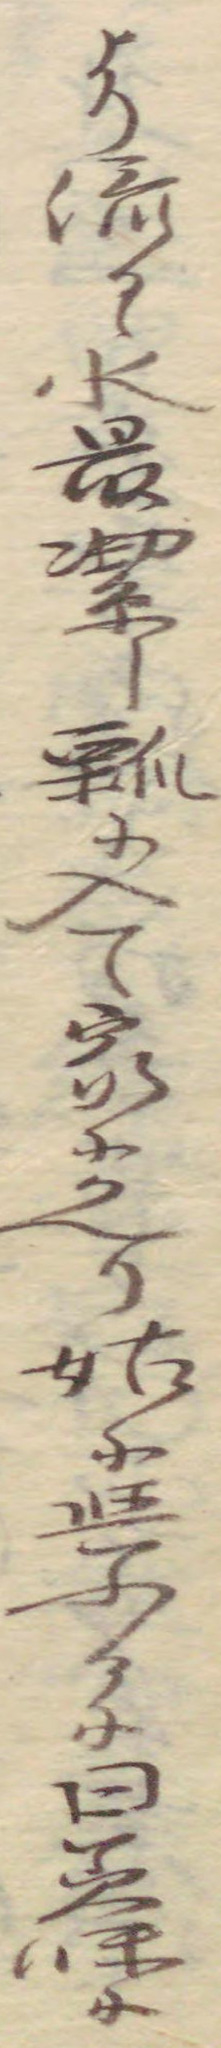より流るゝ水最潔し瓢に入て家にかへり姑に与ふるに曰美味に
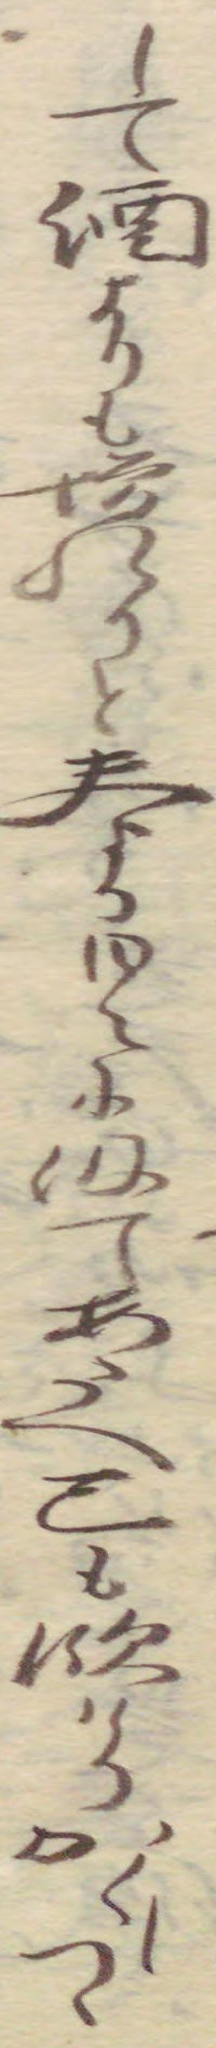して酒よりも増れりと夫より日〻に汲てあたへ己も飲けりかくしつゝ
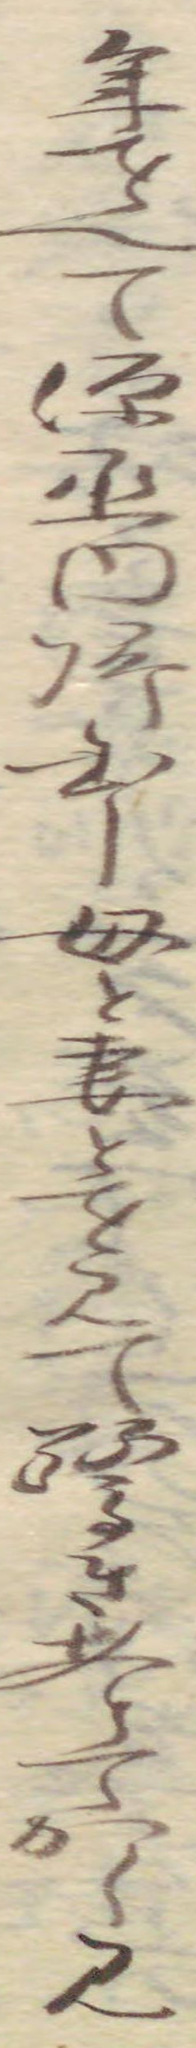年をへて源丞内帰国し母と妻とを見て驚きなとてかく見
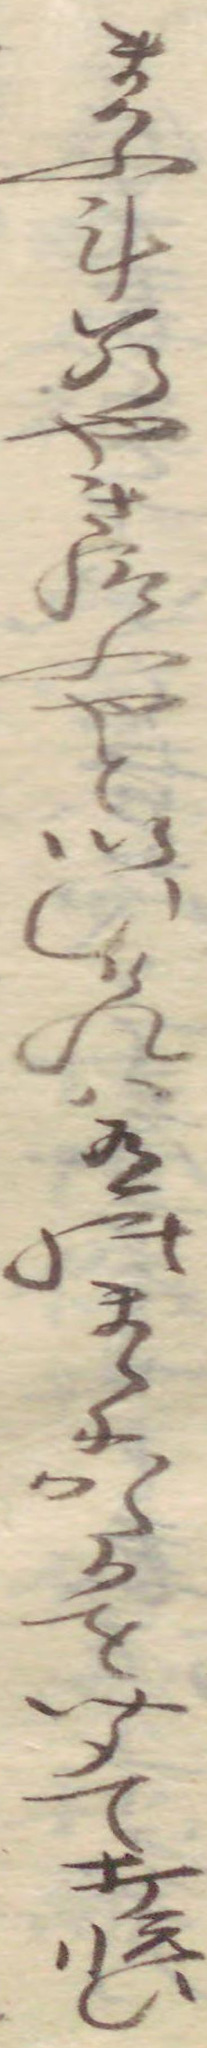まかふ計若やき給ふやといひけれは有のまゝにかたるを聞て打悦ひ
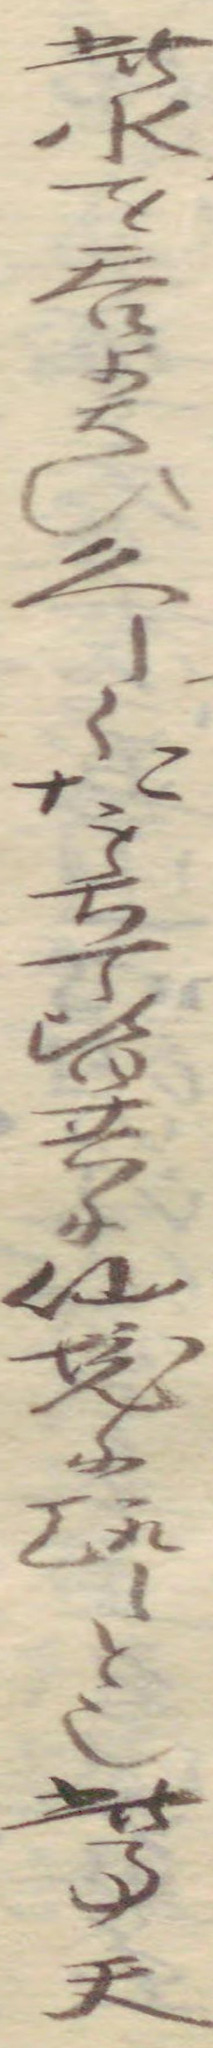此水を呑よはひ久しくたもちて皆共に仙境に趣しと也此事天
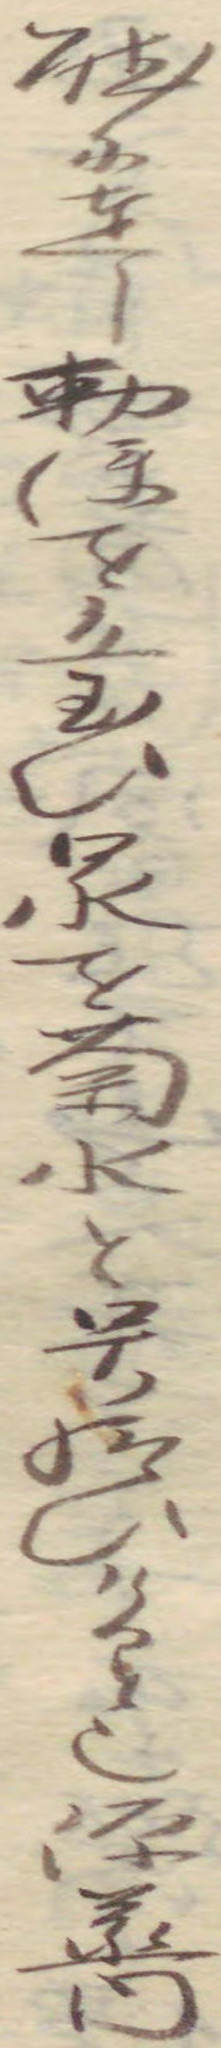聴に達し勅使を立玉ひ泉を菊水と号給ひけると也源丞内
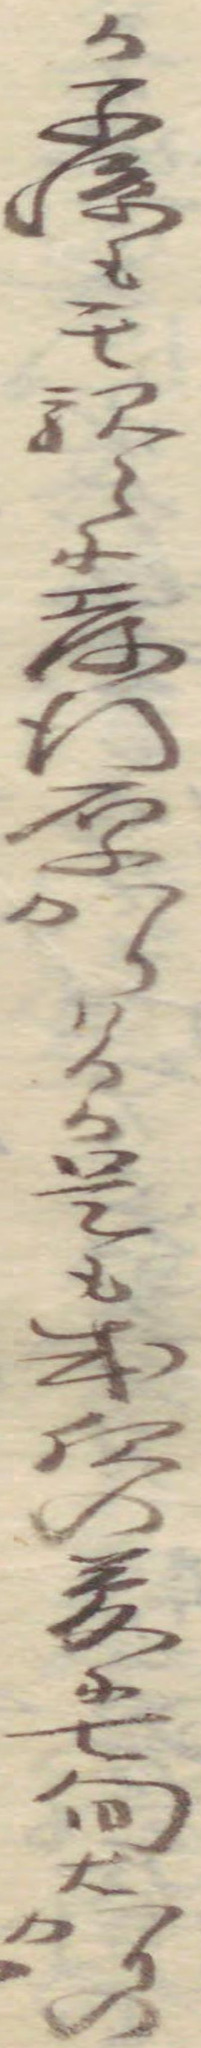か子孫も其親〻に孝行厚かりけるか是も或夜の夢に七旬はかりの
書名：鶯宿雑記. 巻263-264
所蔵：国立国会図書館 National Diet Library, JAPAN
